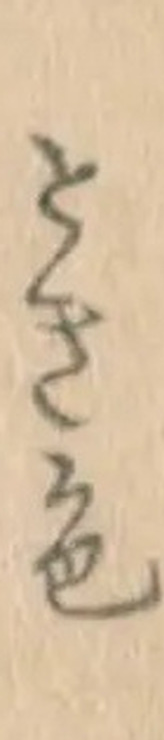とき色
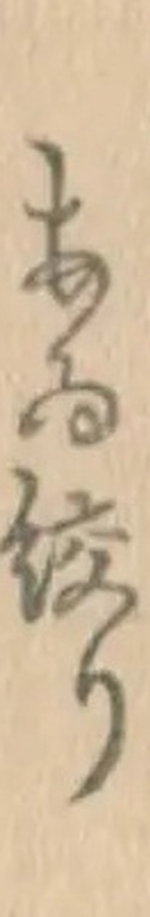あゐ絞り
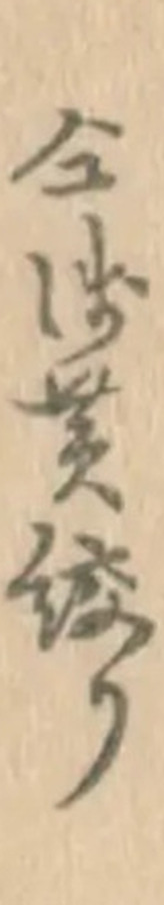仝浅黄絞り

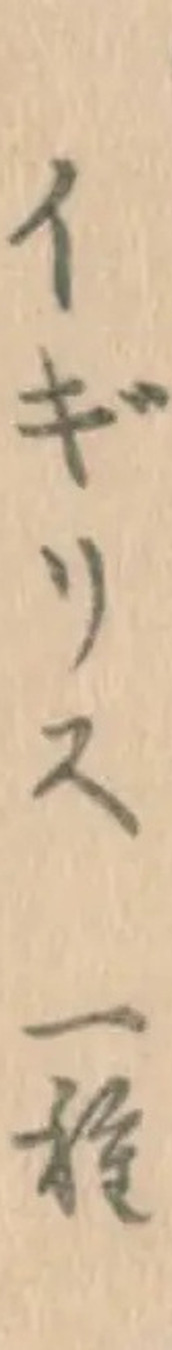イギリス一種
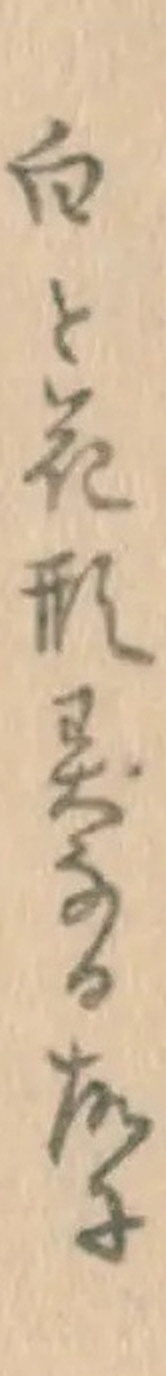白と花形異なる故に
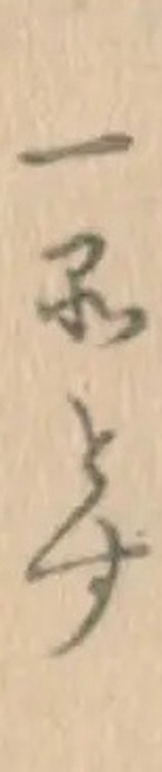一品とす
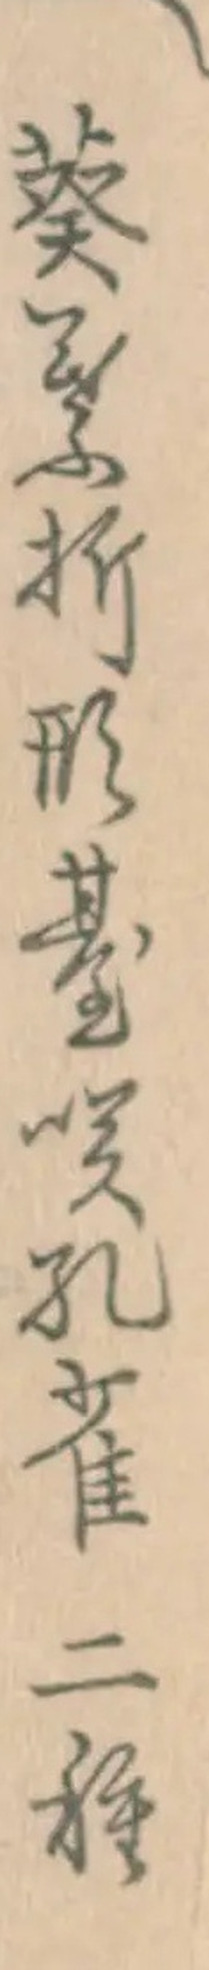葵葉折形台咲孔雀二種

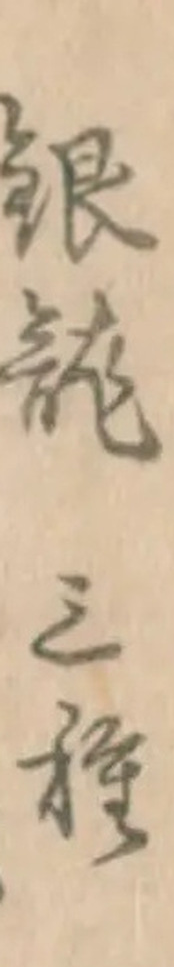銀龍三種
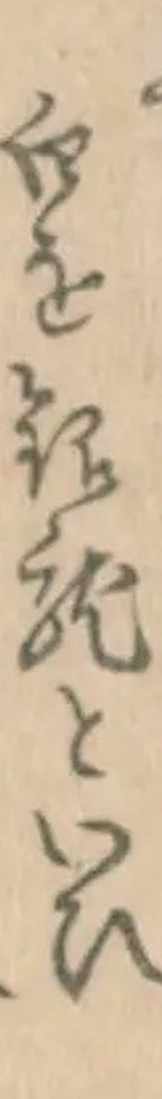白を銀龍といひ
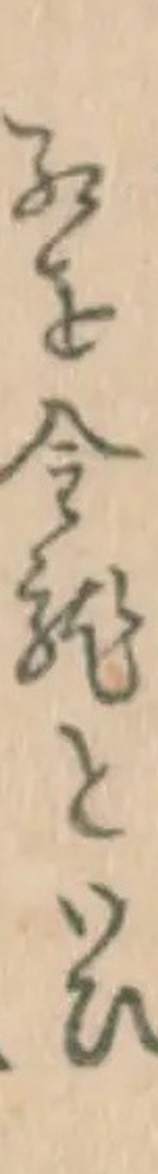紅を金龍といひ
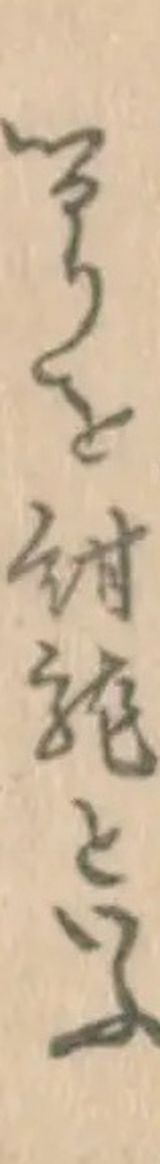るりを紺龍といふ
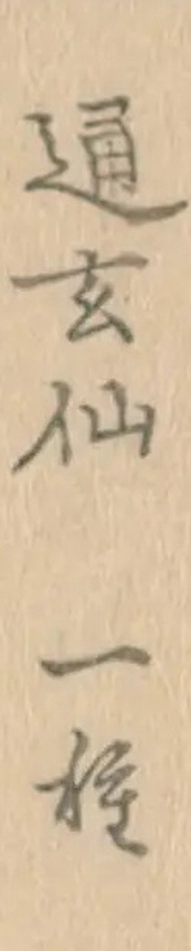通玄仙一種

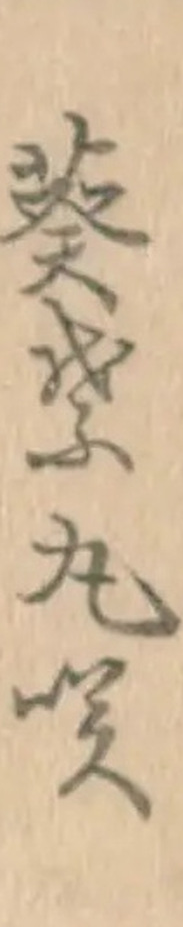葵葉丸咲
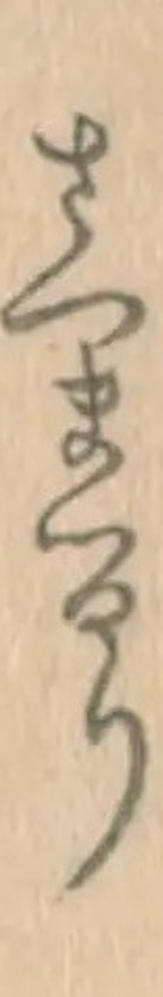さつまるり
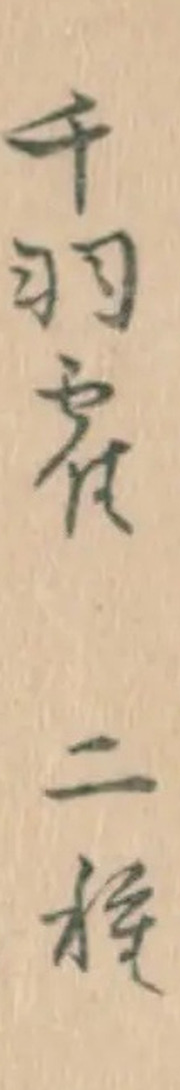千羽鶴二種
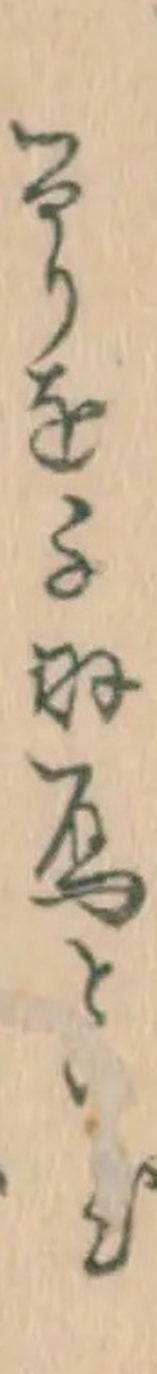るりを千羽烏といひ
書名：朝顔叢. 上巻
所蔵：国立国会図書館 National Diet Library, JAPAN
